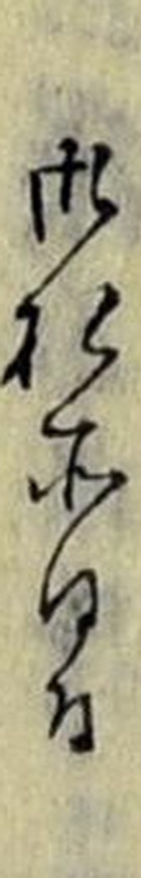御札所目付
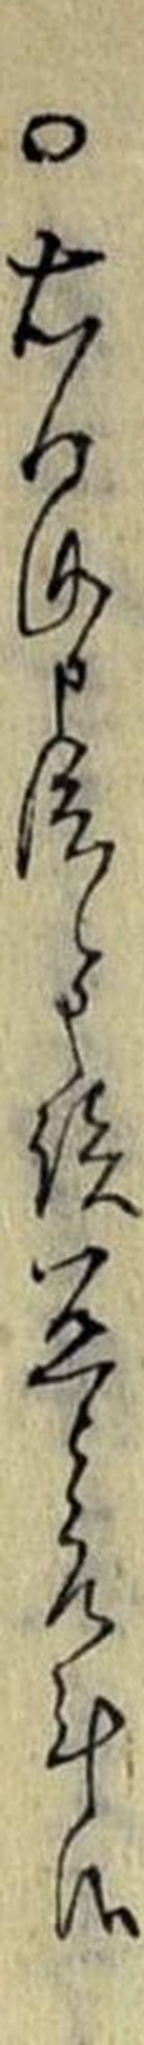○右同趣申渡候申談宜可被取斗候
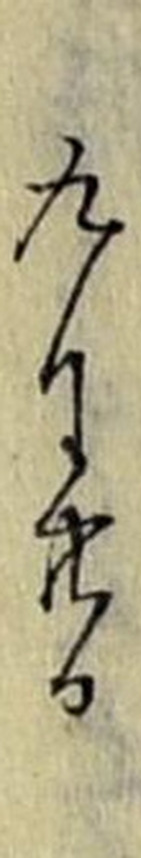九月廿日
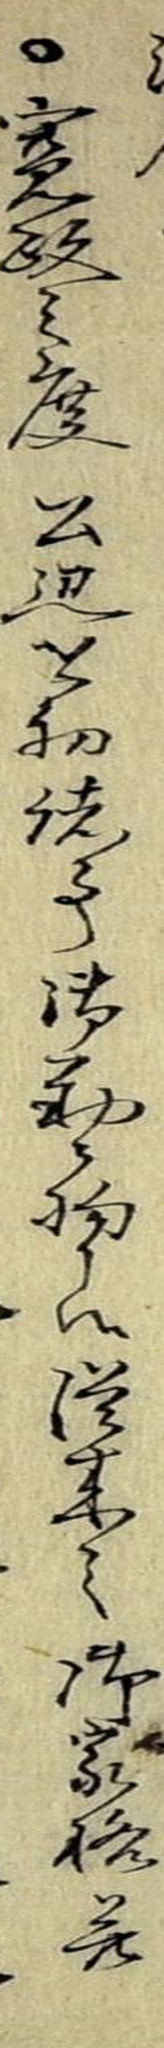○寛政之度公辺を初諸事御勤に拘り候従來之御家格并
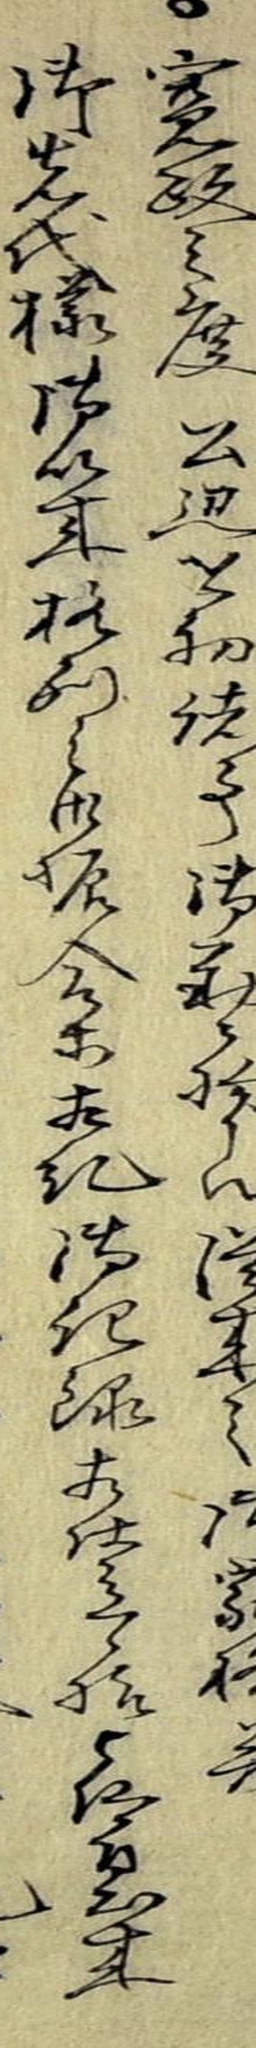御先代様御以來格別之御振合等相糺御記録相仕立候様被仰付出来
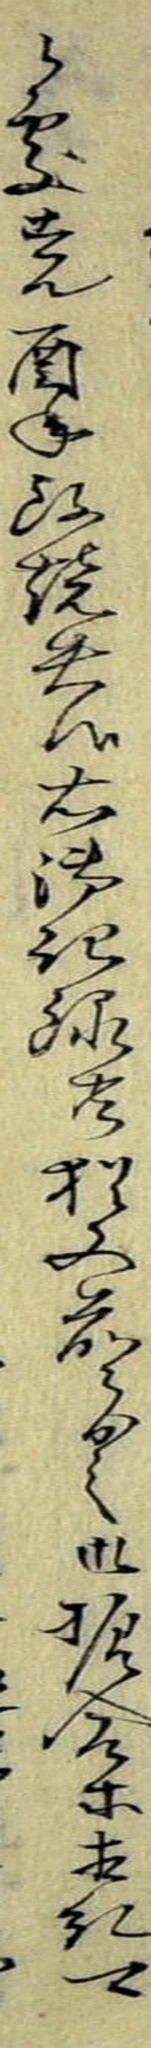候処去ル酉年致焼失候右御記録共猶又前々ゟ之御振合等相糺可
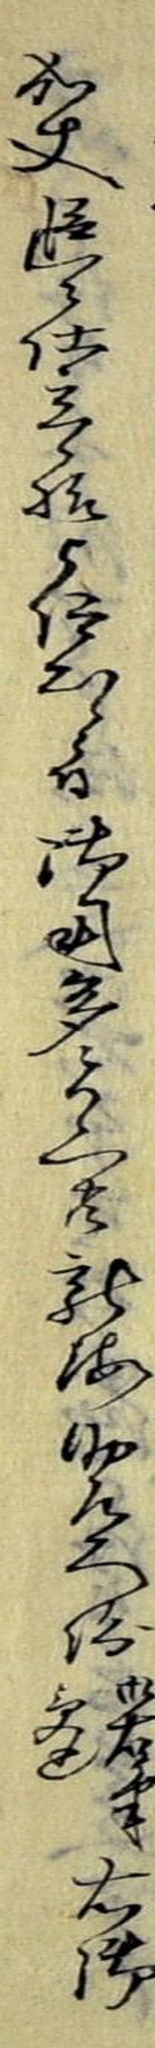成丈追々仕立候様被仰出候に付御用多に候へ共新海助左衛門儀御右筆受込右御

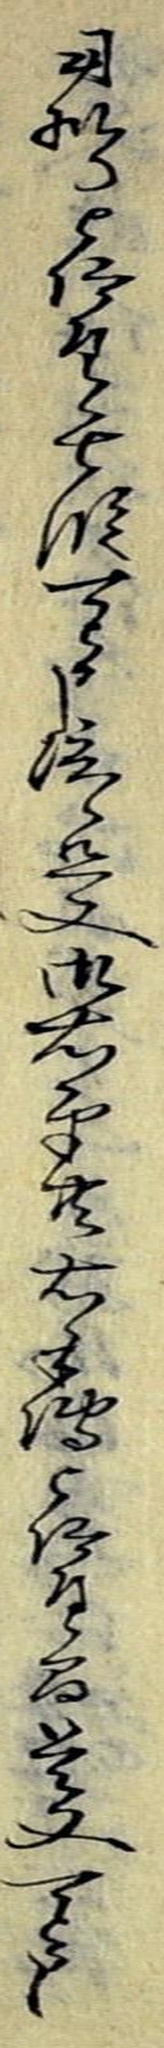用掛り被仰付候其段可被申渡候且又御右筆共右手伝被仰付候間是又可被申
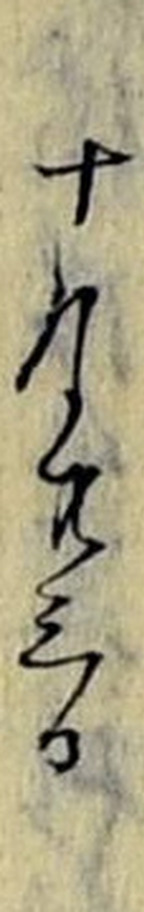十月廿三日
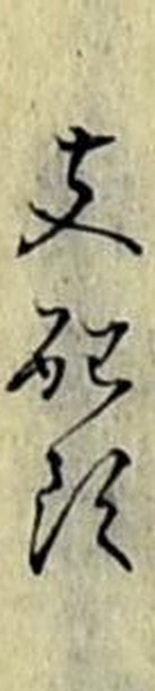支配頭
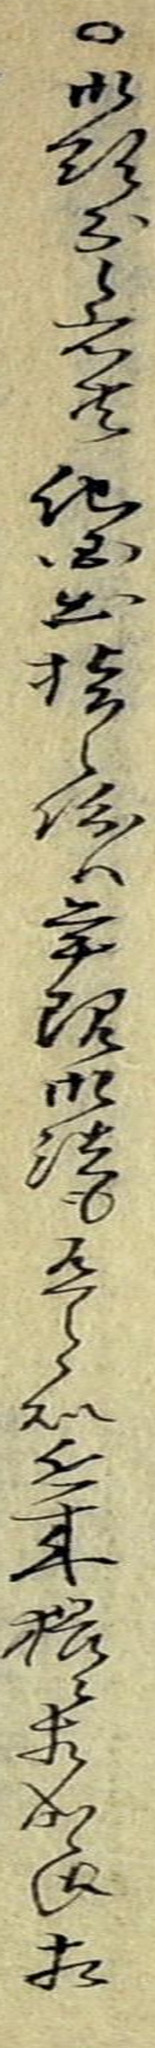○御領分之者共他国出挊之儀は年限御法も有之候処近来猥に相成候趣相
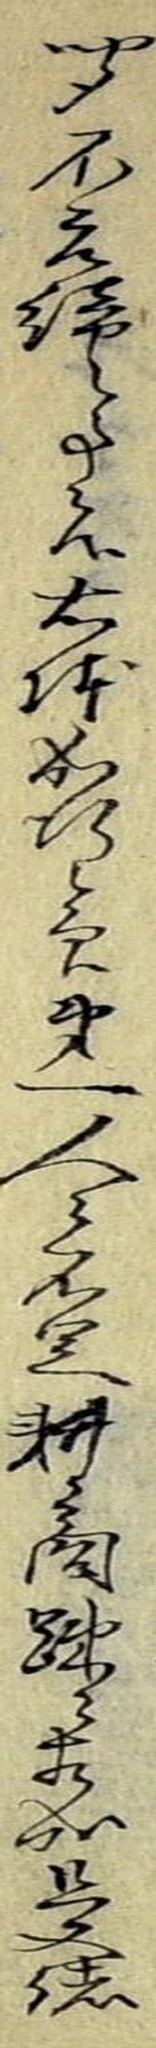聞不取締之事に候右体成行に而は第一人々不足耕商疎々相成且又諸
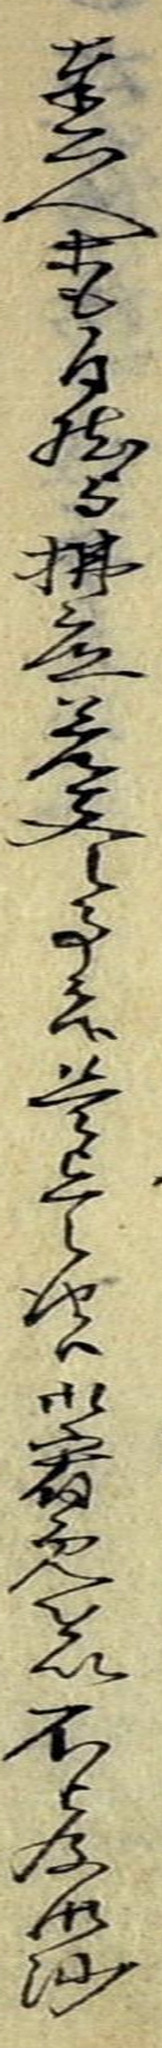奉公人等も自然と払底差支之事に候是迄之儀は御宥免を以不及御沙
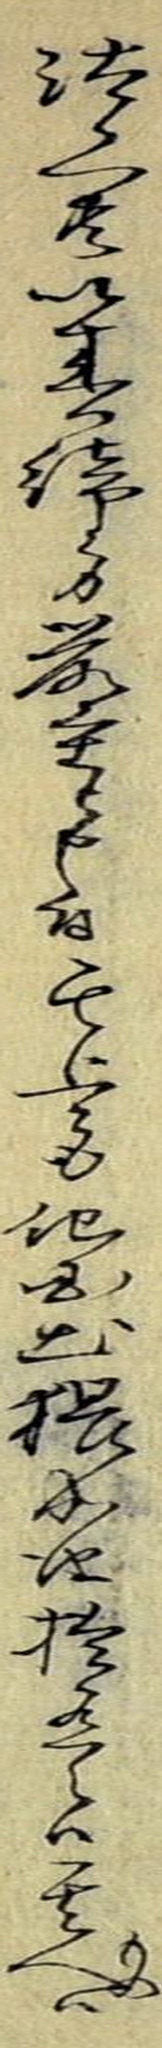汰候へ共以來は締方厳重被申付其上にも他国出猥成儀於有之は其ものへは
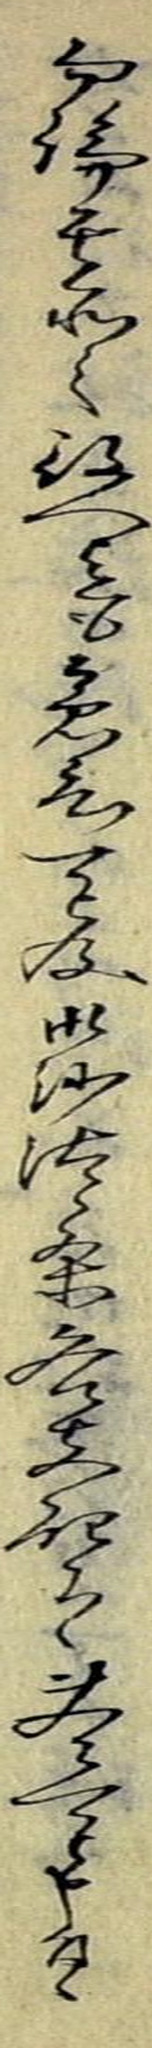勿論其所之役人迄も急度可被及御沙汰候条各支配下へ可被申付候
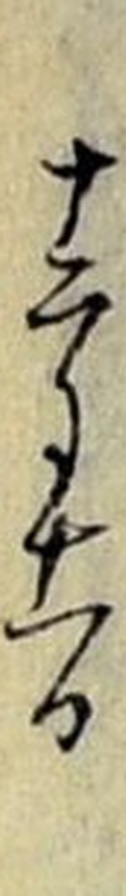十二月十六日
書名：命令之部 六
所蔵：福井県文書館 Fukui Prefectural Archives
